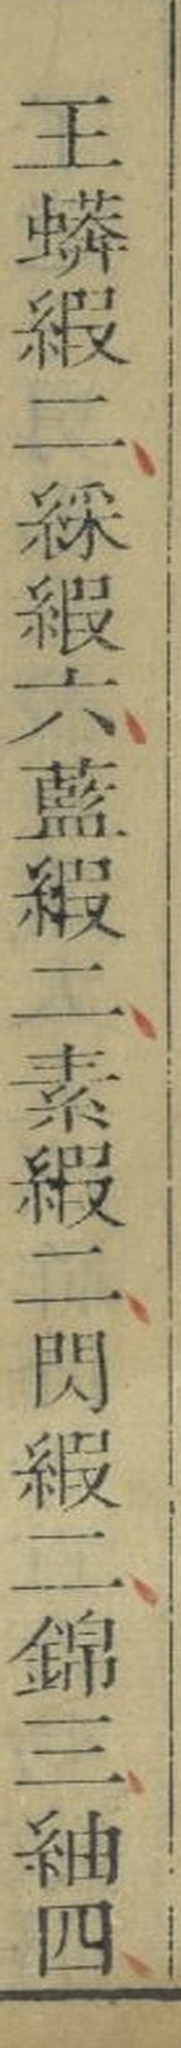王蟒緞二綵緞六藍緞二素緞二閃緞二錦三紬四
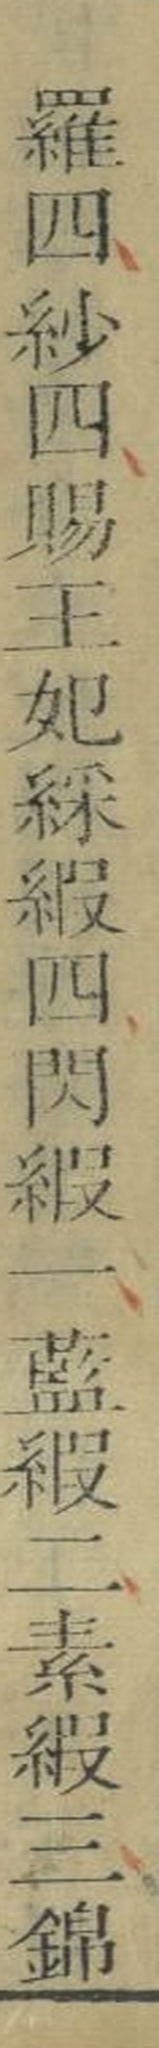羅四紗四賜王妃綵緞四閃緞一藍緞二素緞三錦
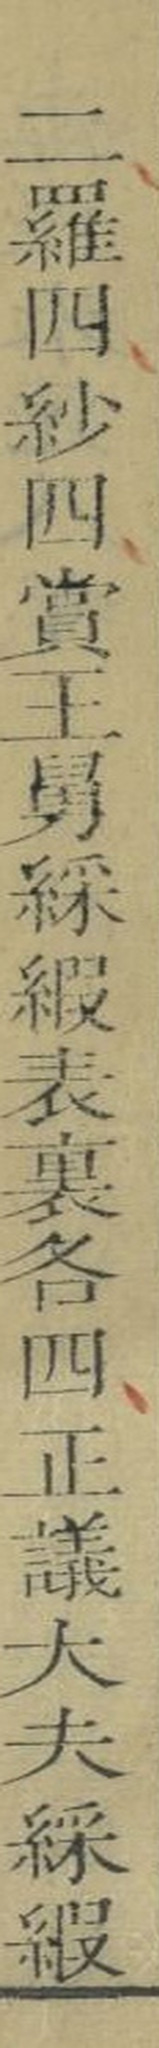二羅四紗四賞王舅綵緞表裏各四正議大夫綵緞
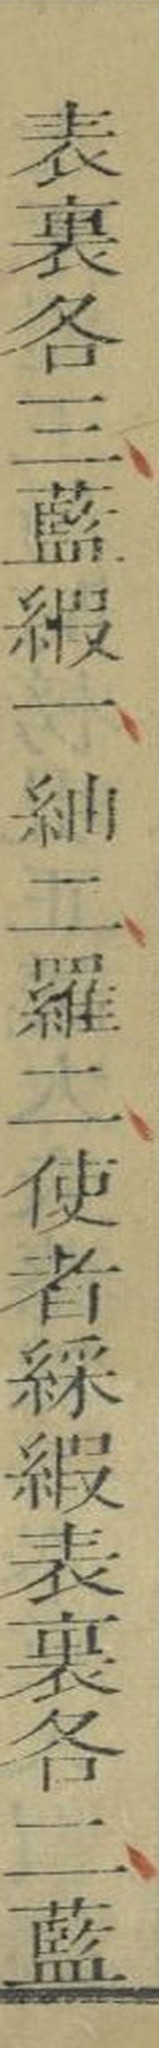表裏各三藍緞一紬二羅二使者綵緞表裏各二藍
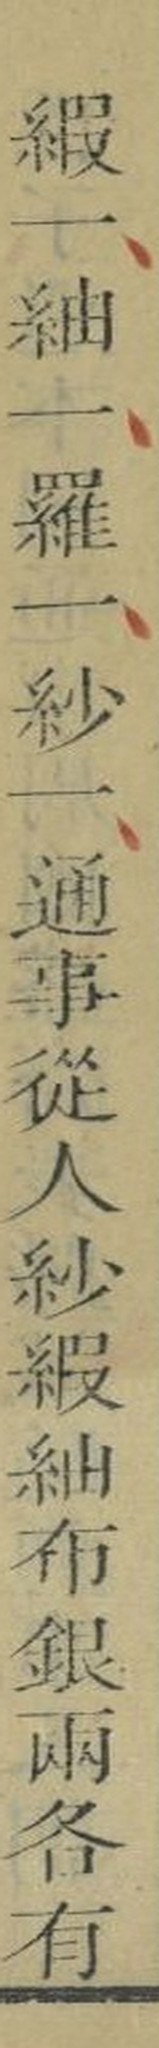緞一紬一羅一紗一通事従人紗緞紬布銀両各有
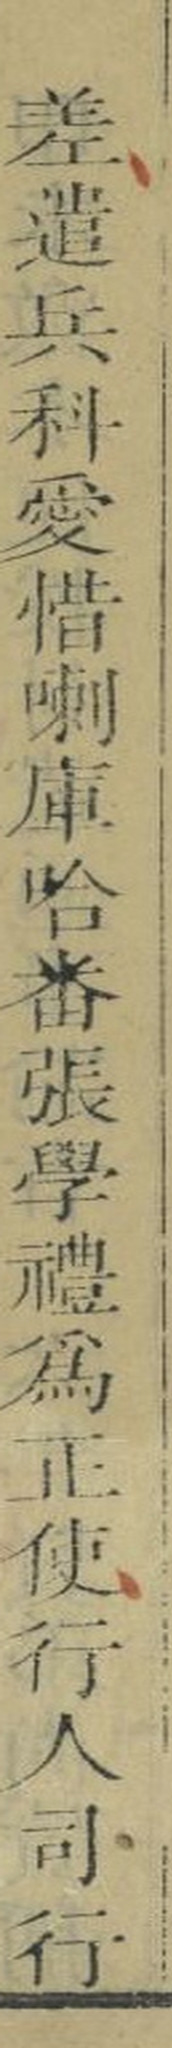差遣兵科愛惜喇庫哈番張学礼為正使行人司行
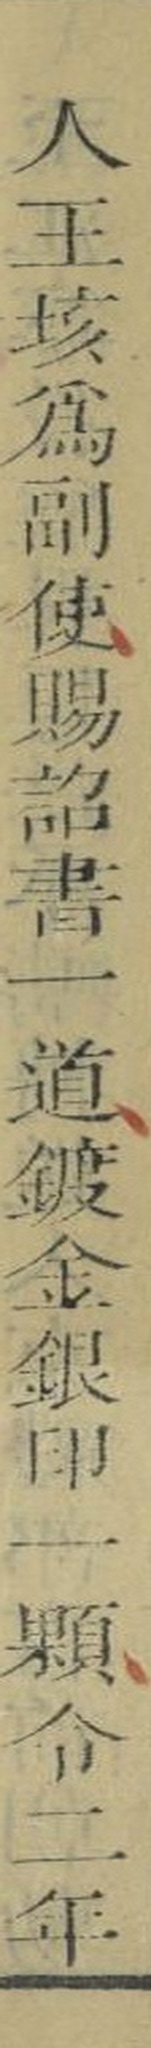人王垓為副使賜詔書一道鍍金銀印一顆令二年
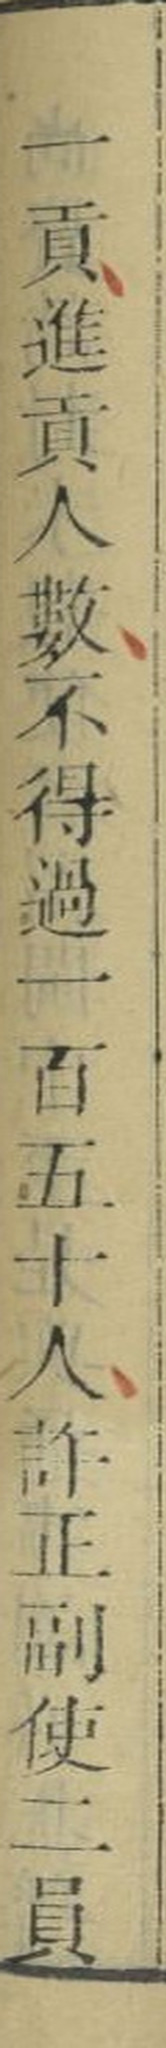一貢進貢人数不得過一百五十人許正副使二員
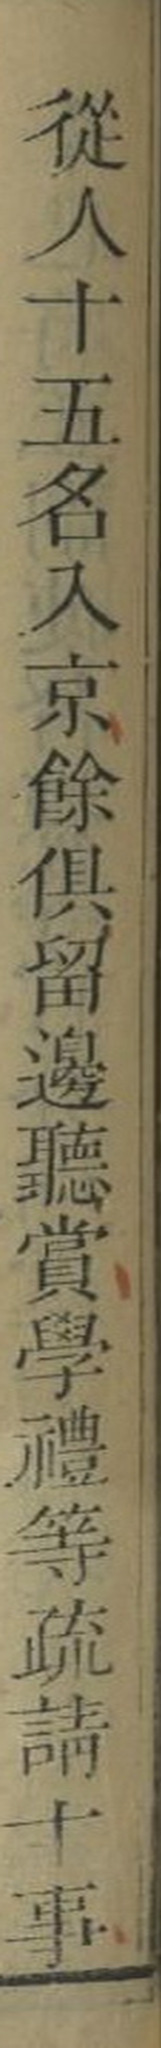従人十五名入京余俱留辺聴賞学礼等疏請十事
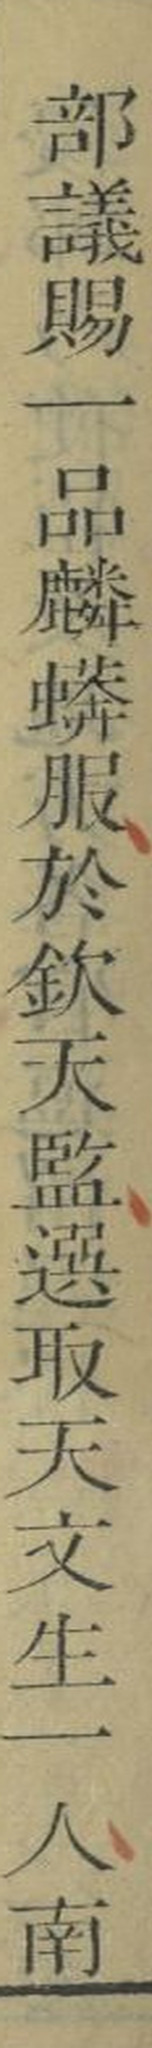部議賜一品麟蟒服於欽天監選取天文生一人南
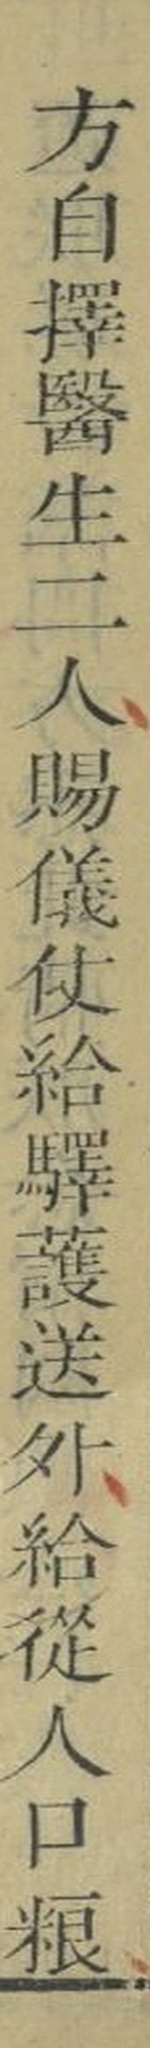方自択医生二人賜儀仗給駅護送外給従人口糧
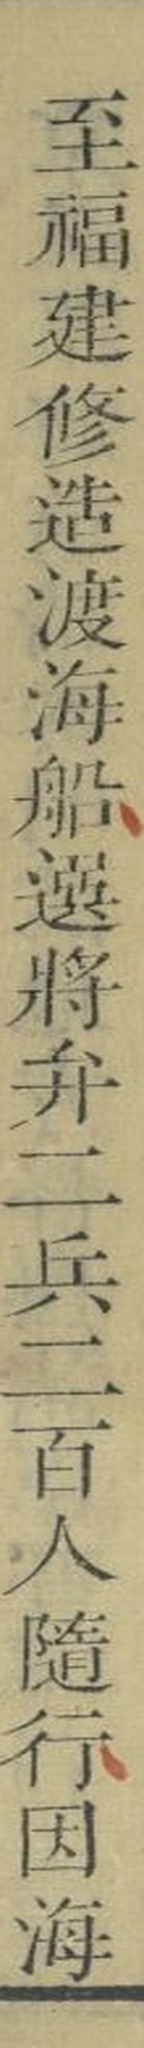至福建修造渡海船選将弁二兵二百人随行因海
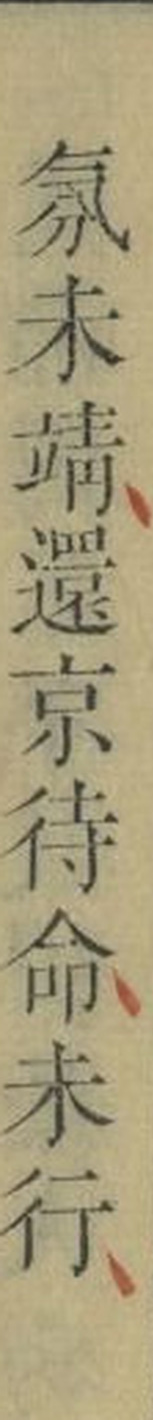氛未靖還京待命未行
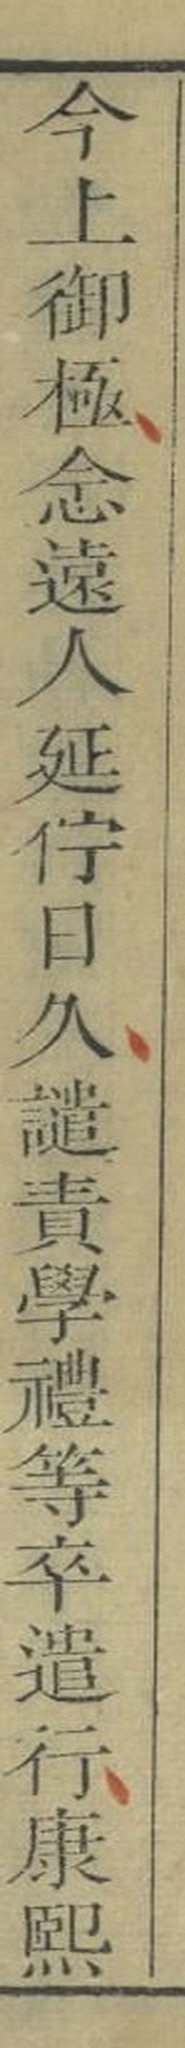今上御極念遠人延佇日久譴責学礼等卒遣行康煕
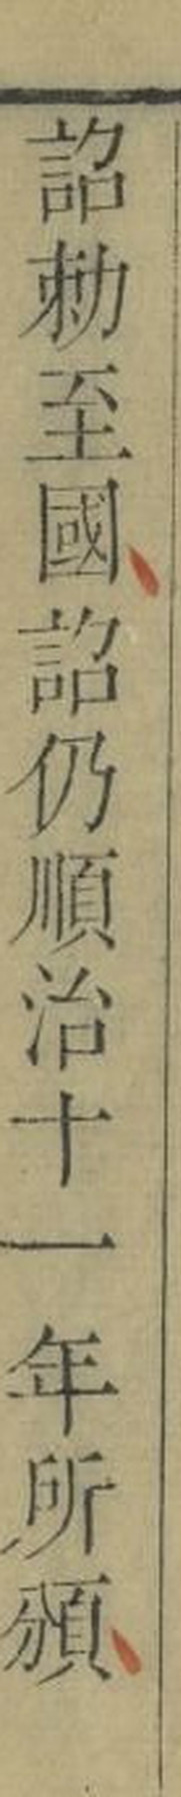詔勅至国詔仍順治十一年所頒
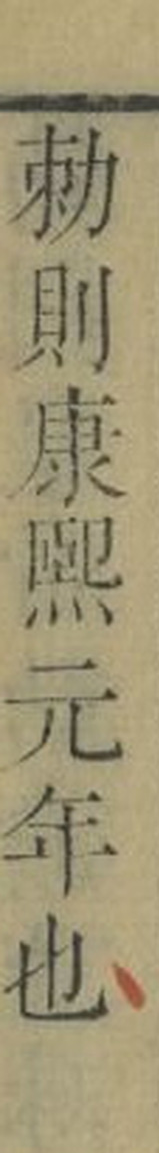勅則康煕元年也
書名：中山伝信録 巻三
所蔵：University of the Ryukyus Library
